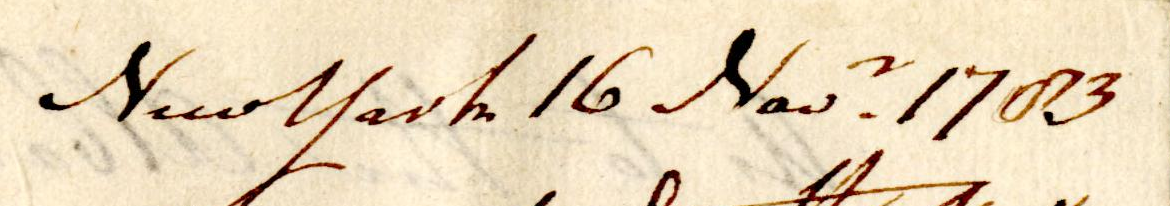New York 16 Nov^r. 1783
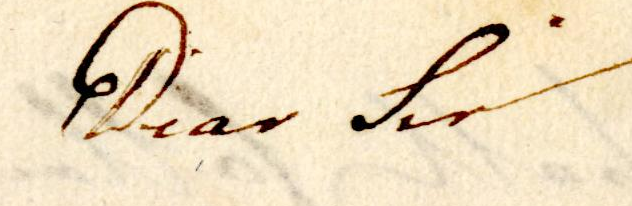Dear Sir
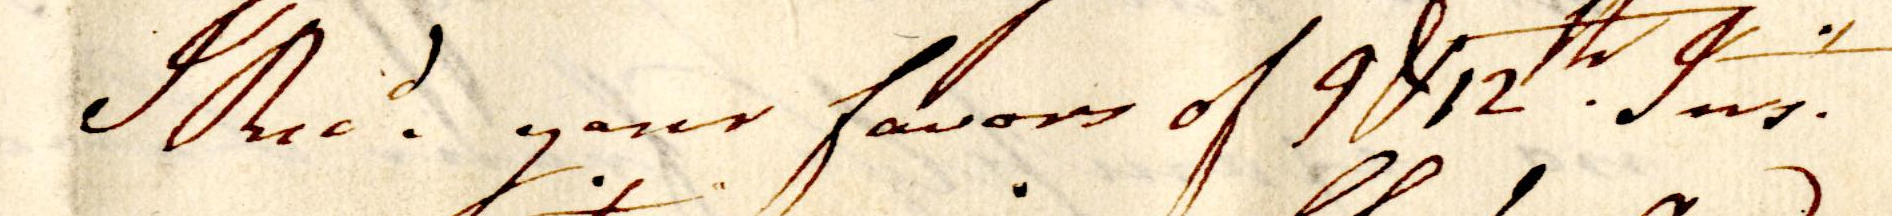I Rec^d. your favors of 9 & 12^th. Ins^t.
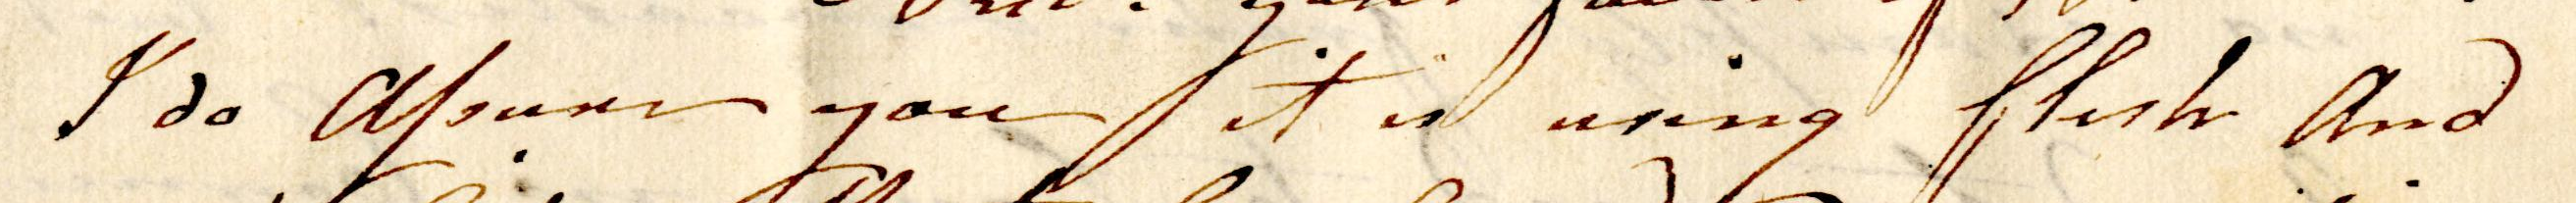I do Assure you it is using flesh And
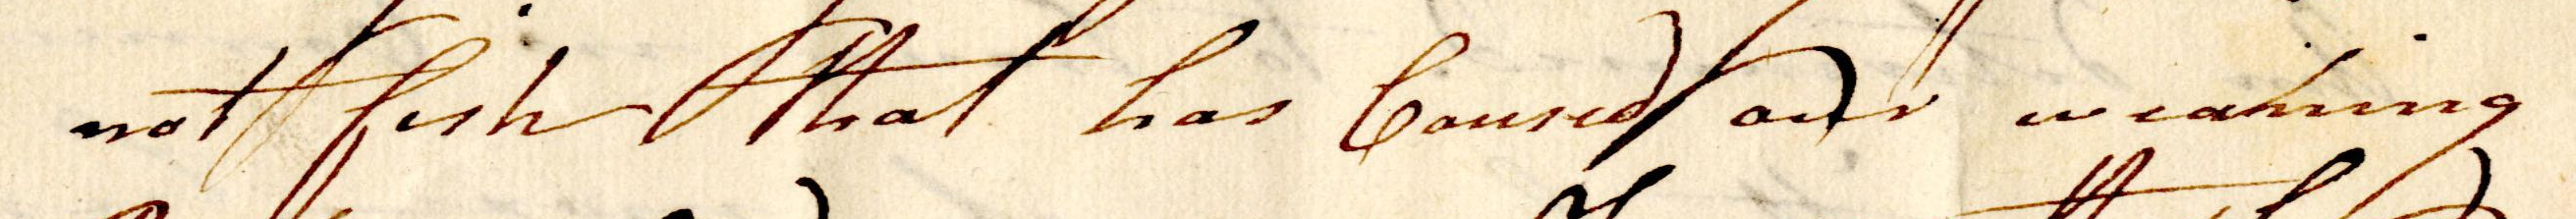not fish & that has Caused our weakening
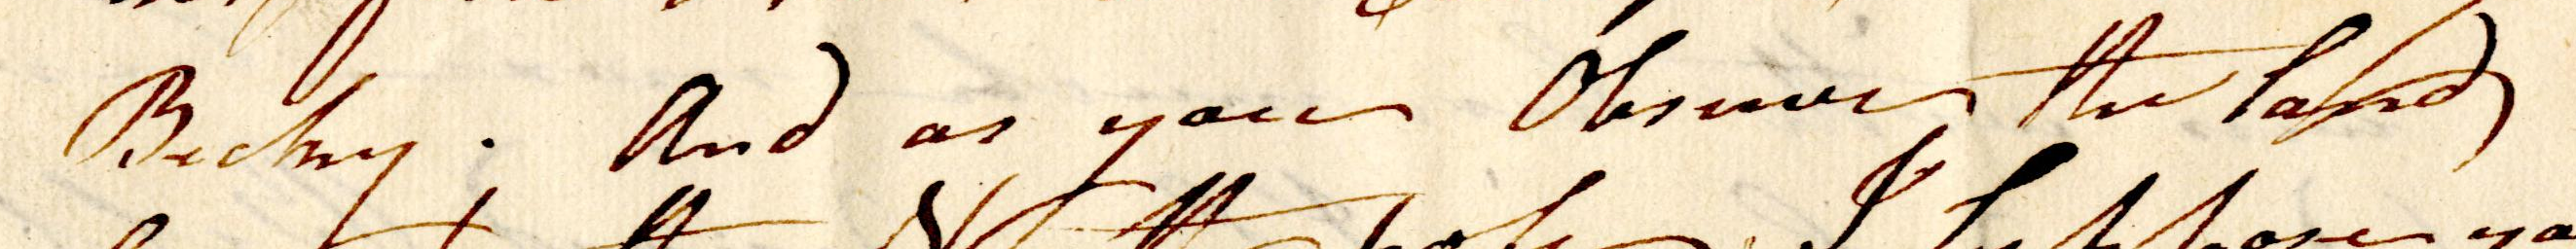Bechy. And as you observe, the land
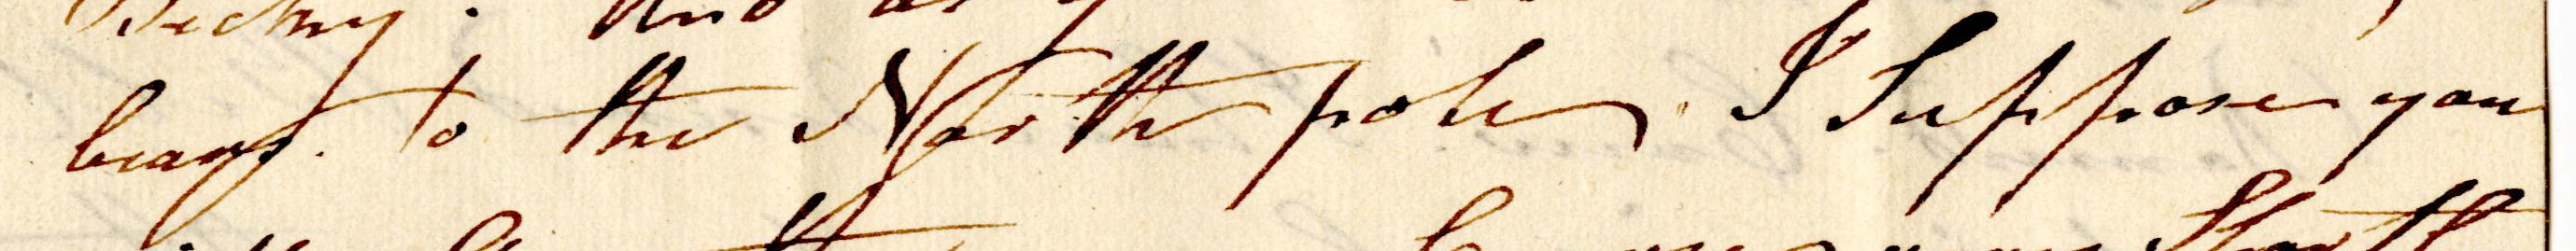bears to the North pole I Suppose you
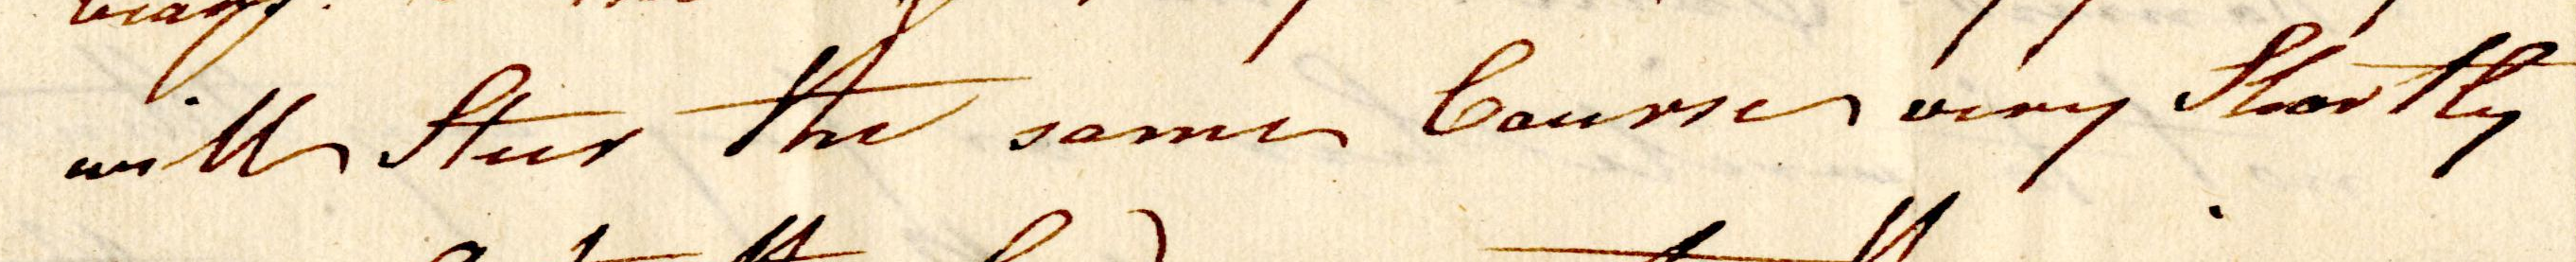will Steer the same Course very shortly
